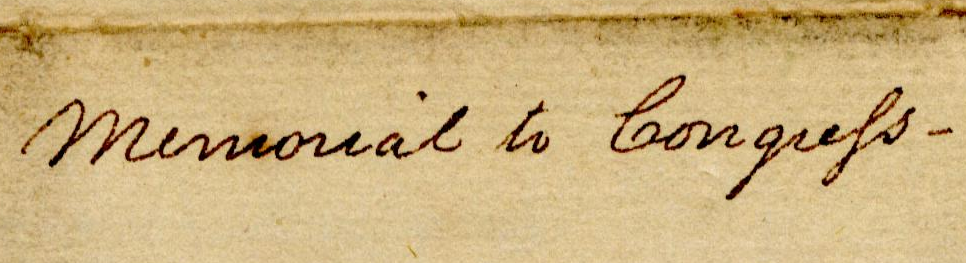Memorial to Congress
